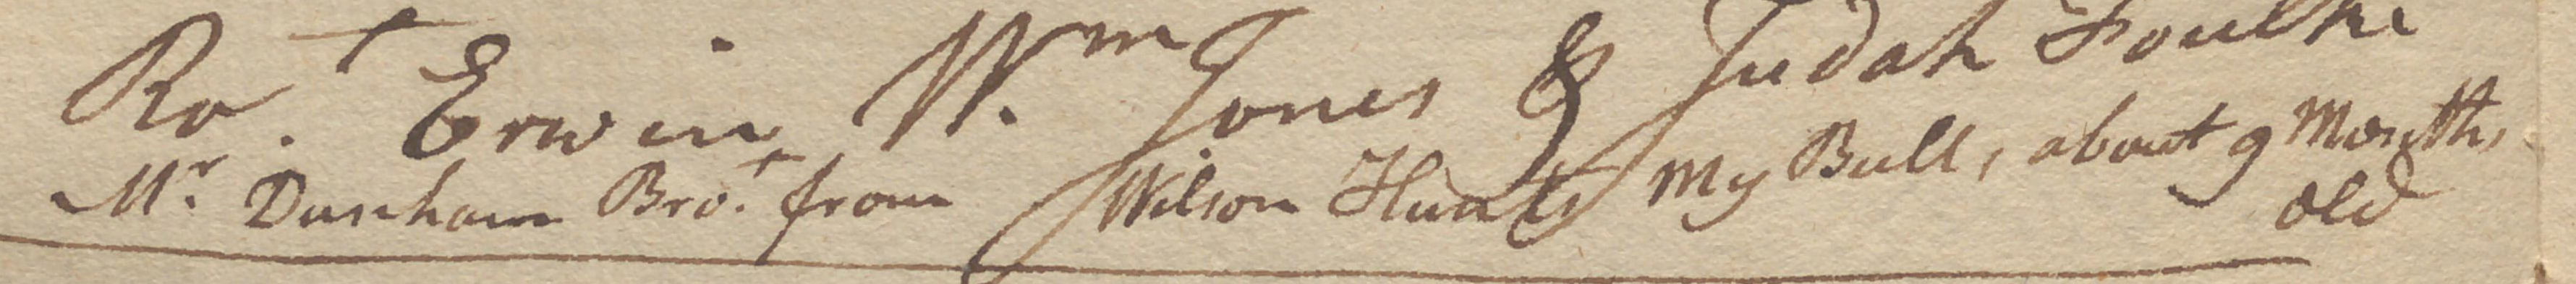M^r. Durham Bro^t. from Wilson Hunts My Bull, about 9 Months
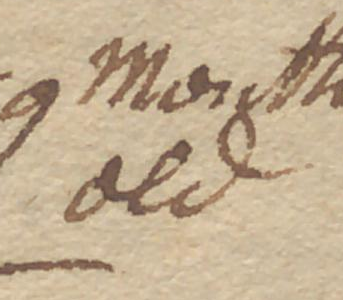old
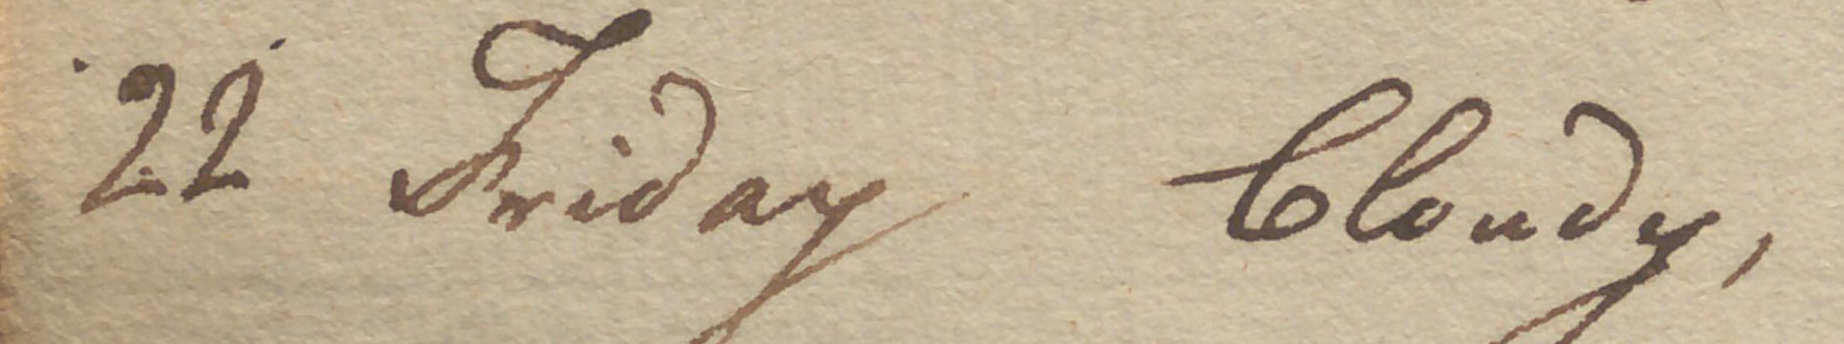22 Friday Cloudy,
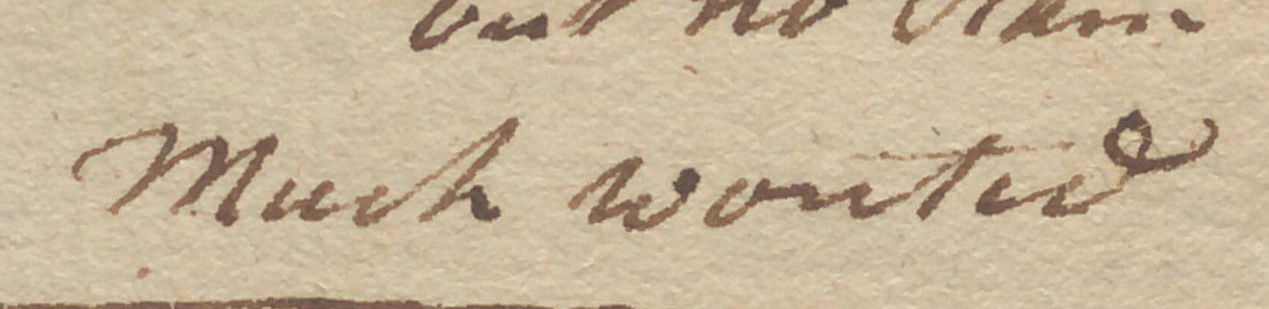Mush wanted
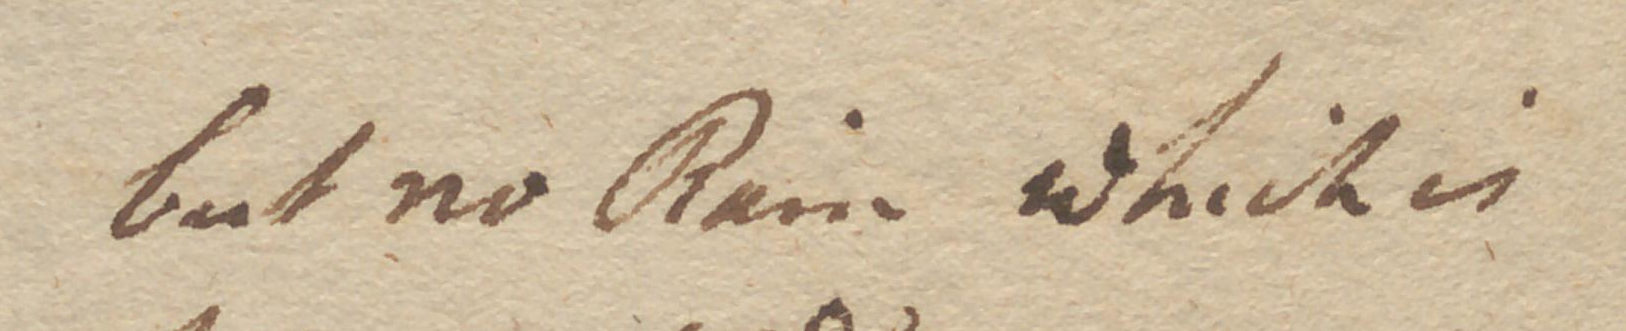but no Rain which is
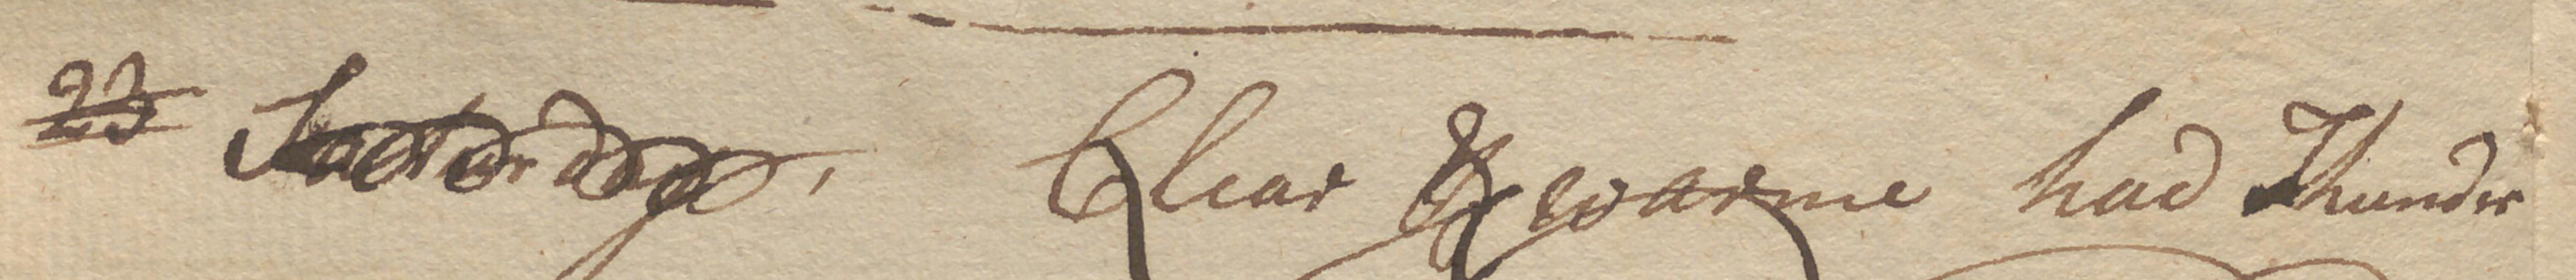[23 Saturday]. Clear & warme had Thunder
